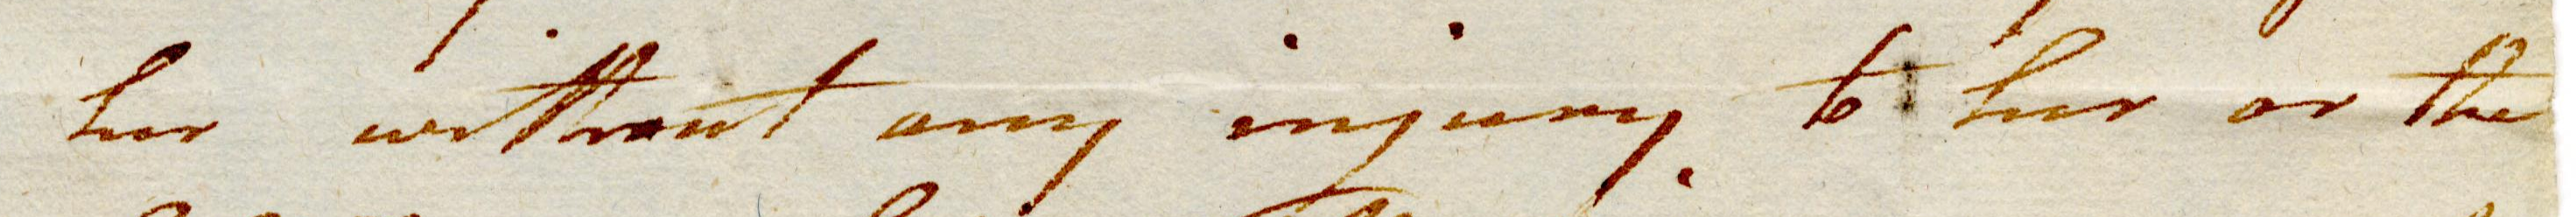her without any injury to her or the
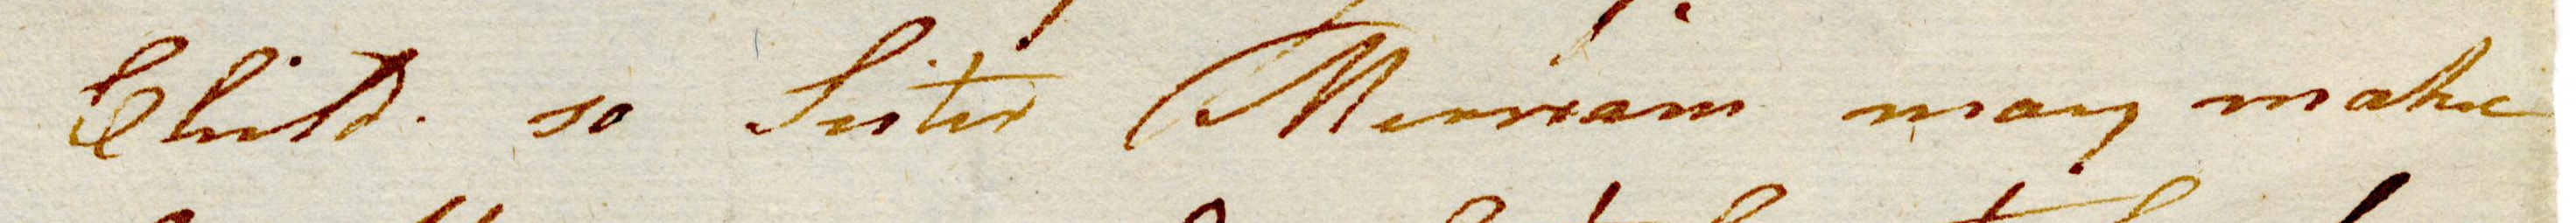Child. so Sister Merriam may make
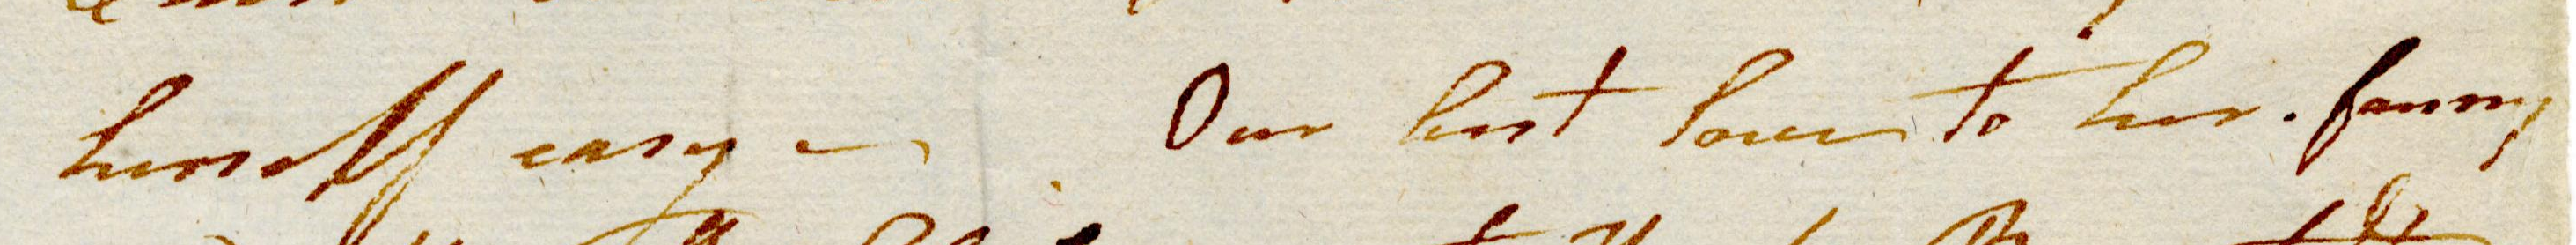her off easy- Our Past love to her family
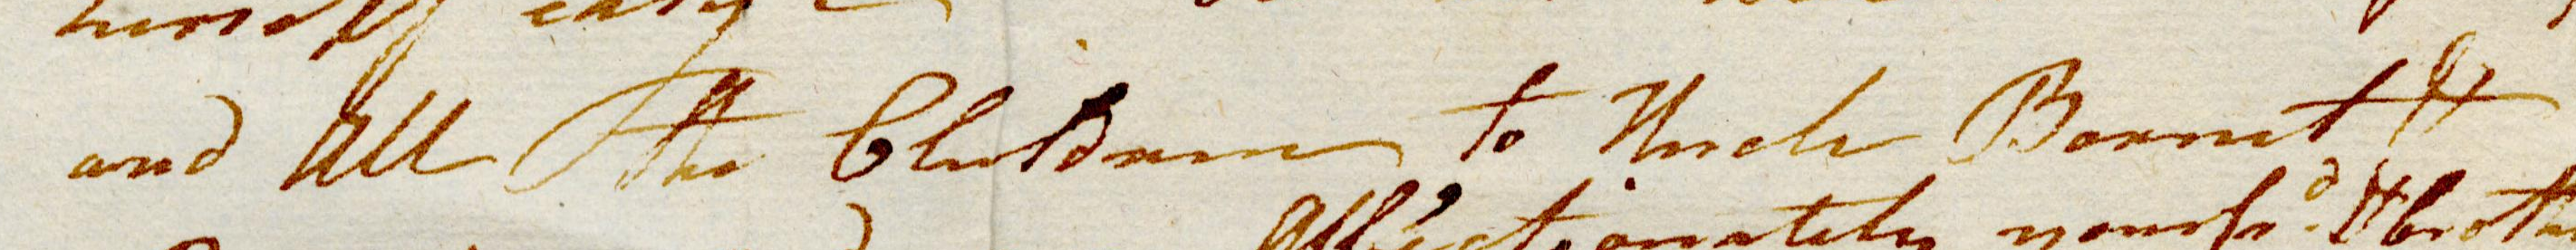and All the Children to Uncle Barnard &
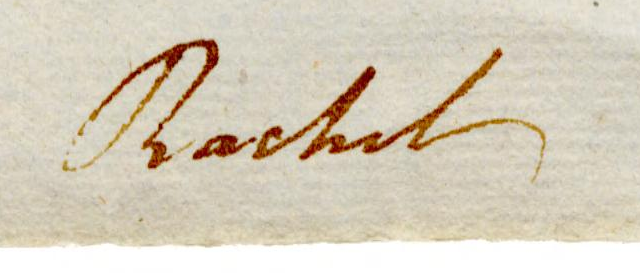Rachael
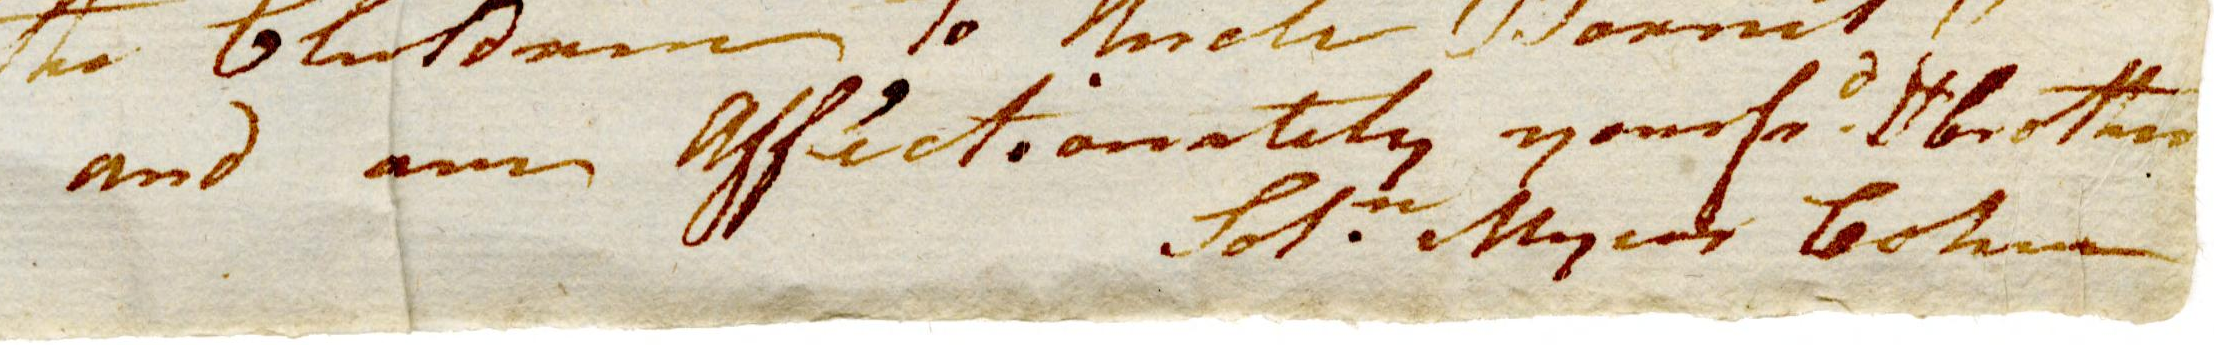and am Affectionately yours^d. & brother
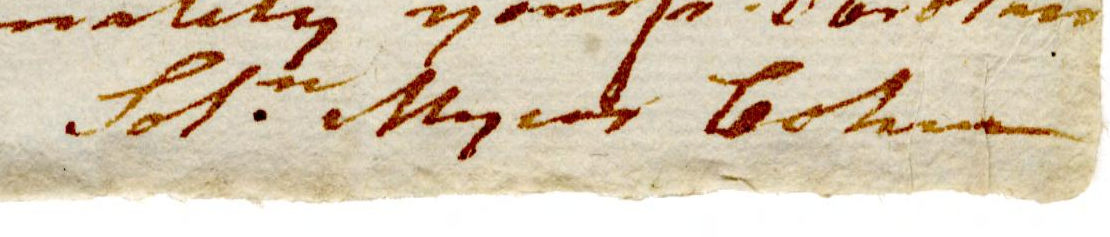Sol^n. Myers Cohen
